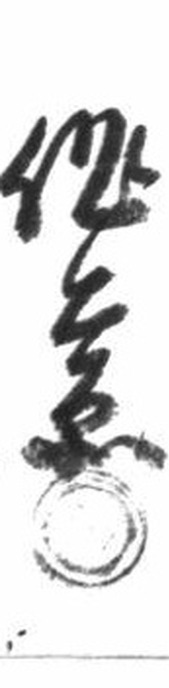作兵衛
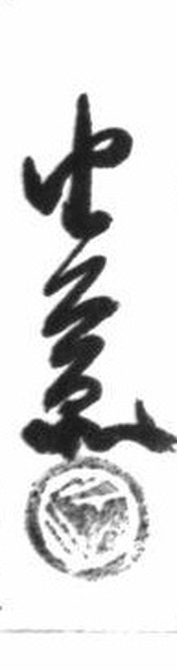由兵衛
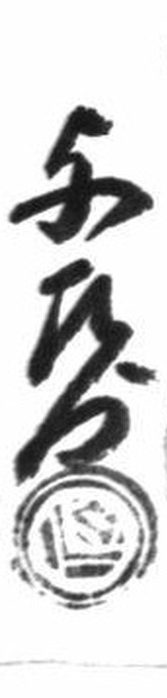与左衛門
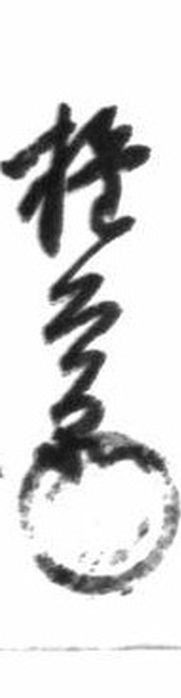権兵衛
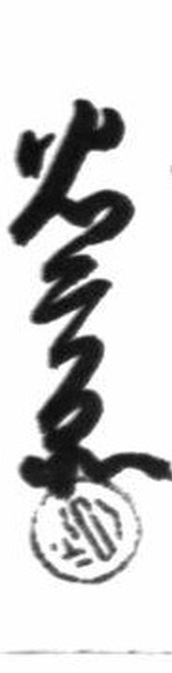忠兵衛
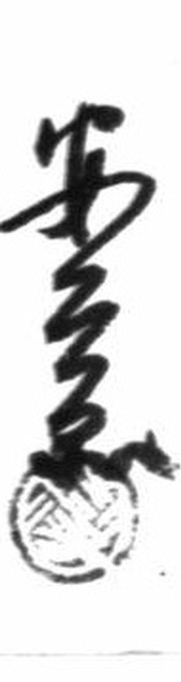安兵衛
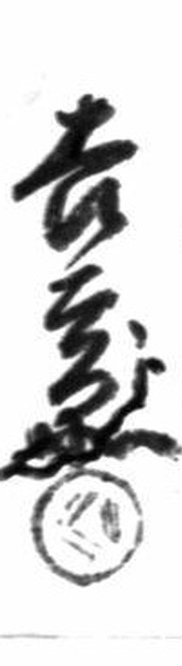吉兵衛
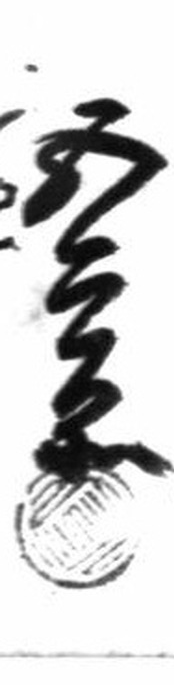五兵衛
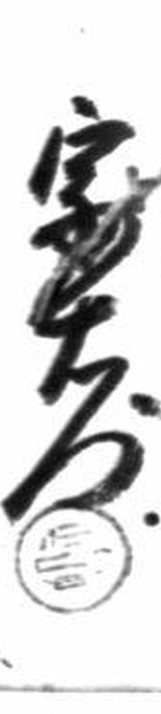宗右衛門
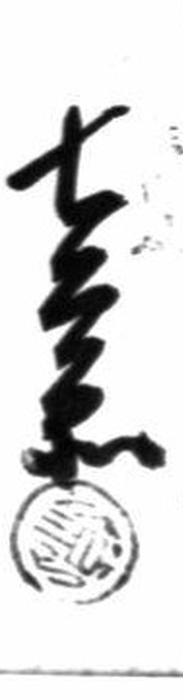門兵衛
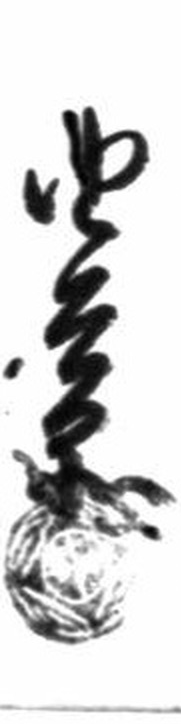由兵衛
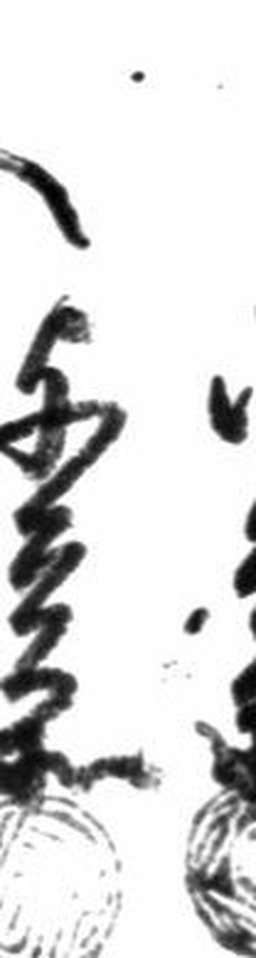門兵衛

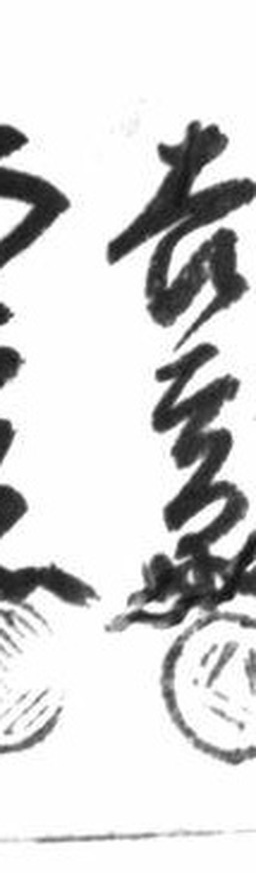七兵衛
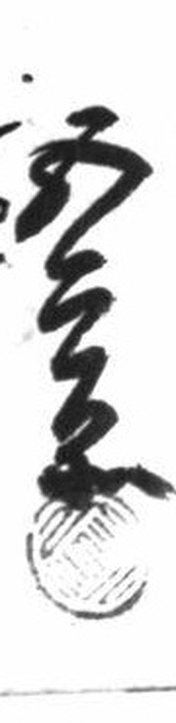五兵衛
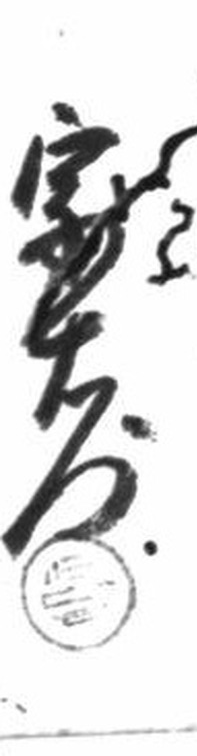与三右衛門
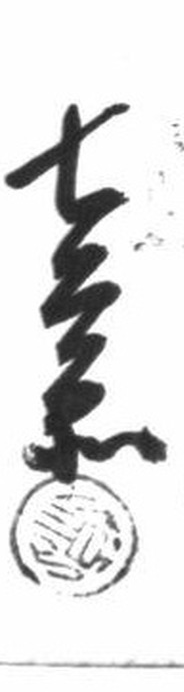七兵衛
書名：宝永弐酉五月火之用心護摩之灰御改帳証文
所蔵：福井県文書館 Fukui Prefectural Archives
